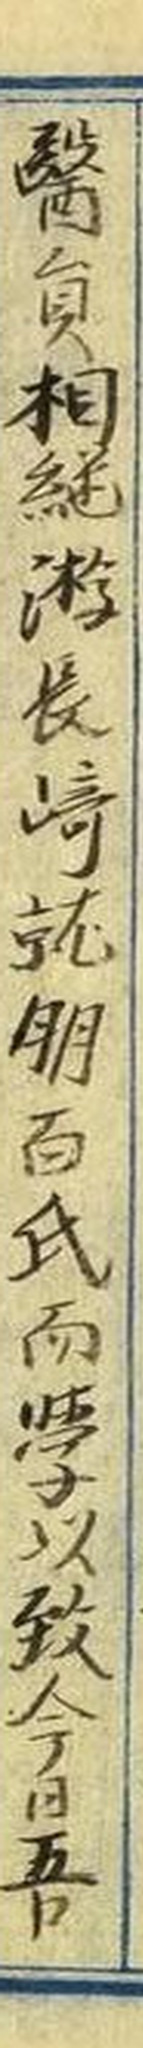醫員相継游長崎就朋百氏而學以致今日吾
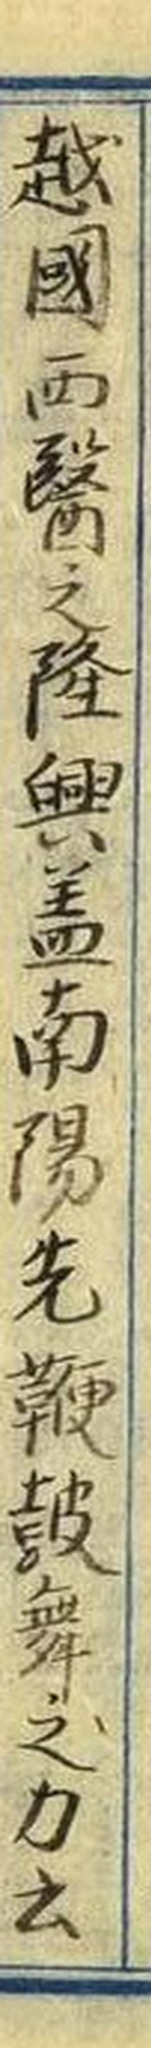越國而醫之隆興盖南陽先鞭皷舞之力云
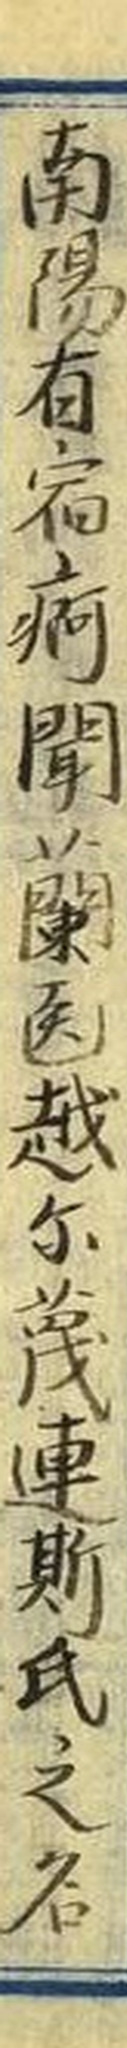南陽者宿痾聞蘭医越尓蔑連斯氏之名
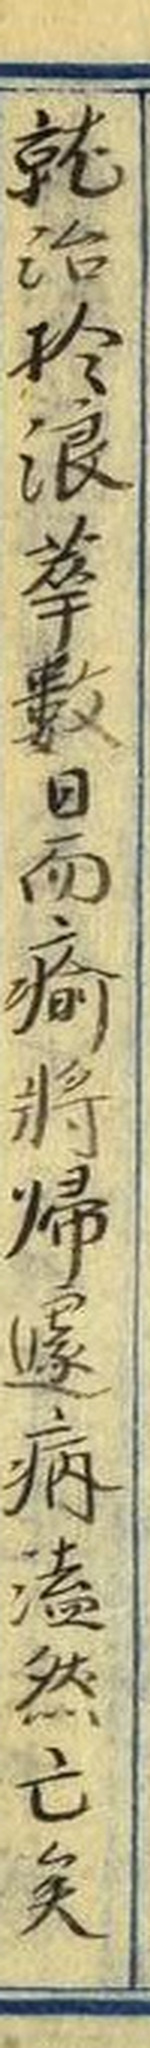就治於浪蕐數日而瘉將帰遽病溘然亡矣

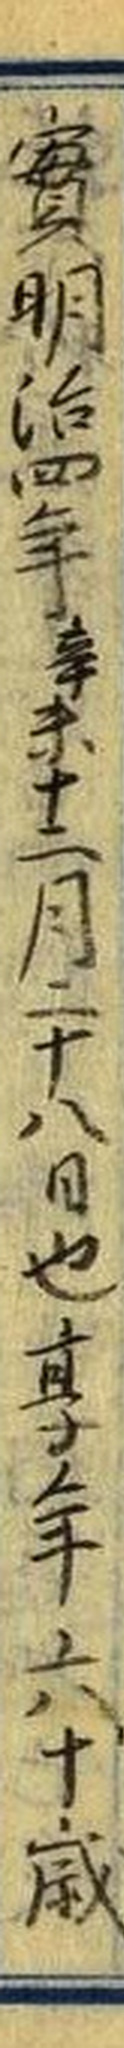實明治四年辛未十二月二十八日也享年六十歳
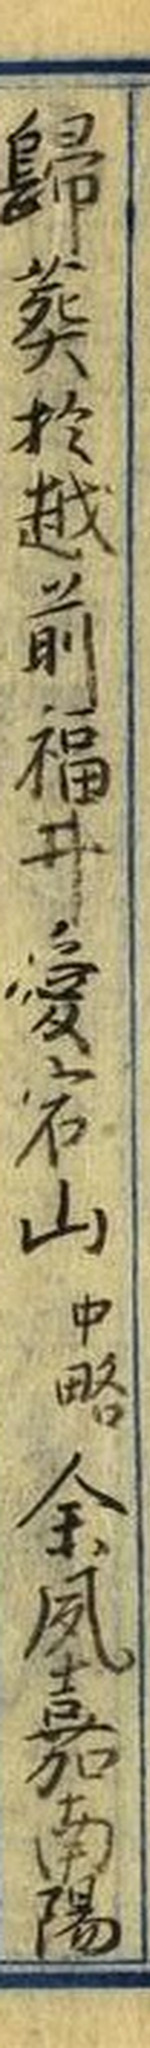歸葬於越前福井愛宕山中略余夙嘉南陽
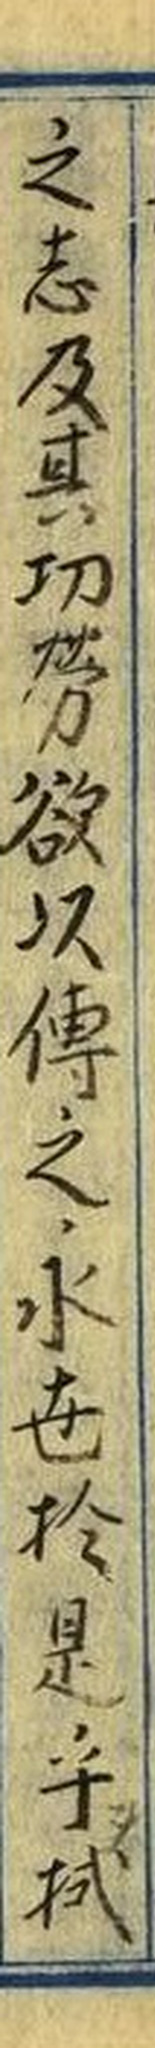之志及其功勞浴以傳之永世於是乎ヲ拭
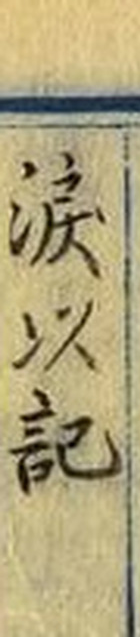涙以記
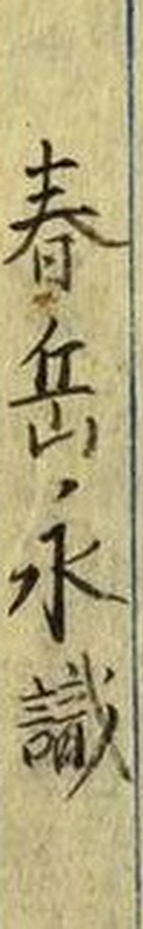春岳永識
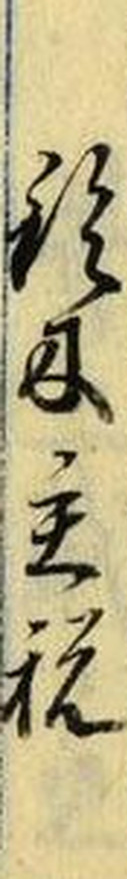鈴木主税
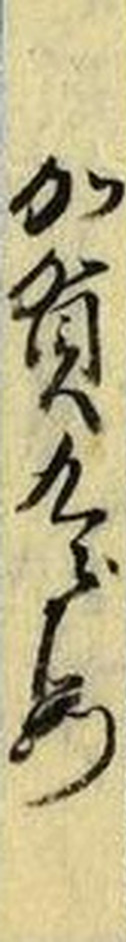加賀九郎右衛門
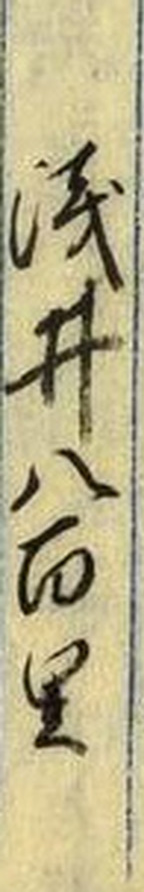浅井八百里
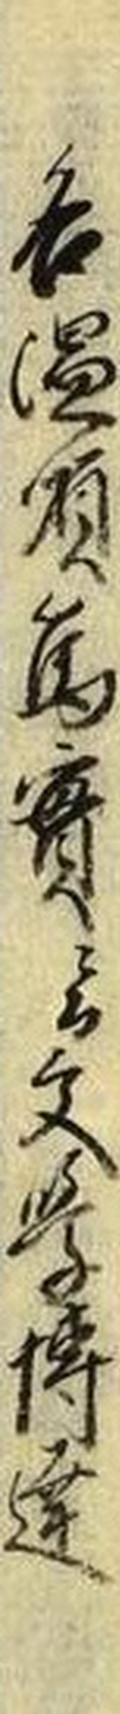各温順篤実に而文学博達
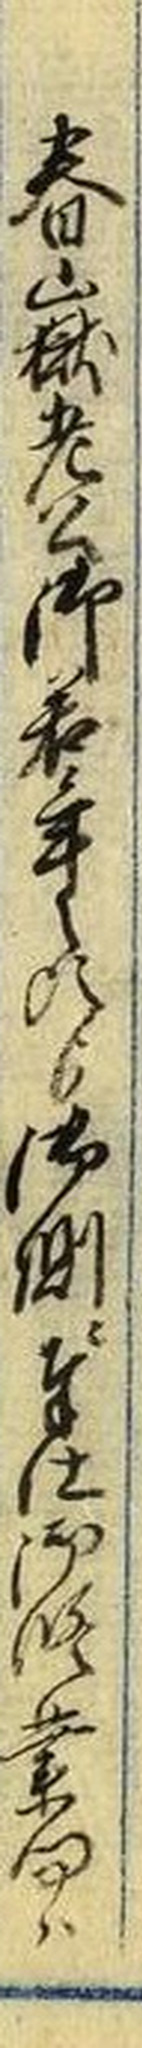春嶽老公御若年之頃ゟ御側に奉仕御修業向は
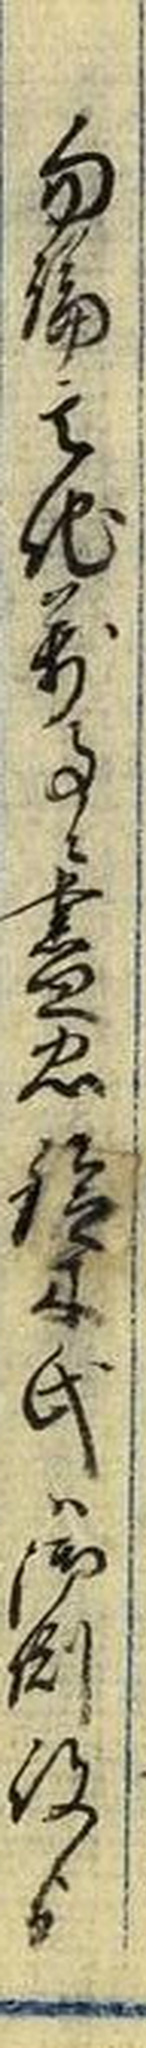勿論其他万事に尽忠鈴木氏は御側役ゟ
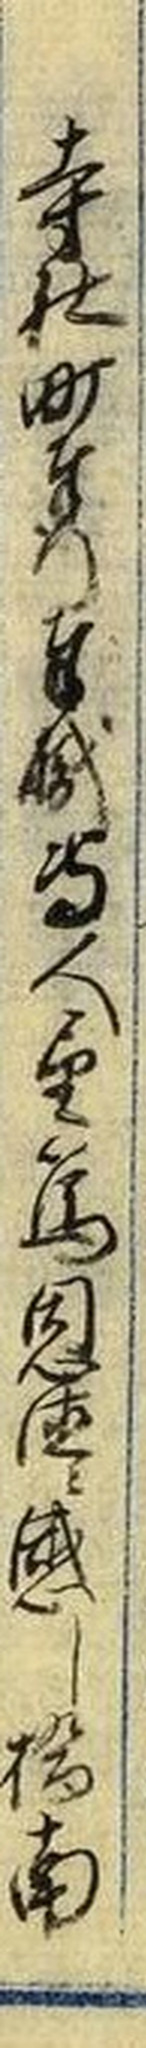寺社町奉行奉職専人望篤恩徳に感し橋南
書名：温古集 四巻
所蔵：福井県文書館 Fukui Prefectural Archives
